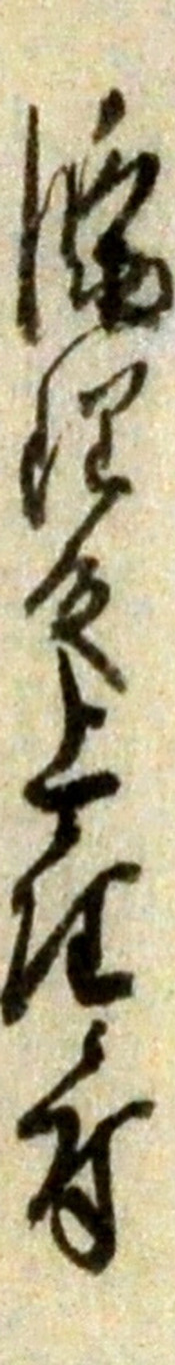修理殿上座ニ付
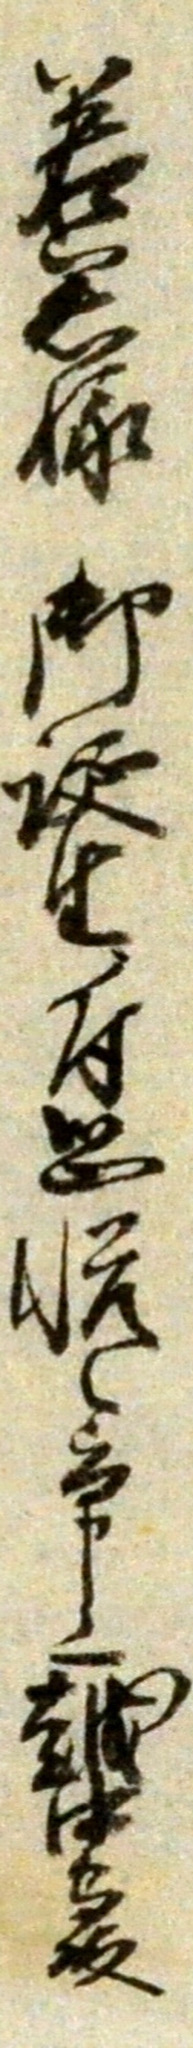若君様御誕生ニ付恐悦之旨申上越中守殿
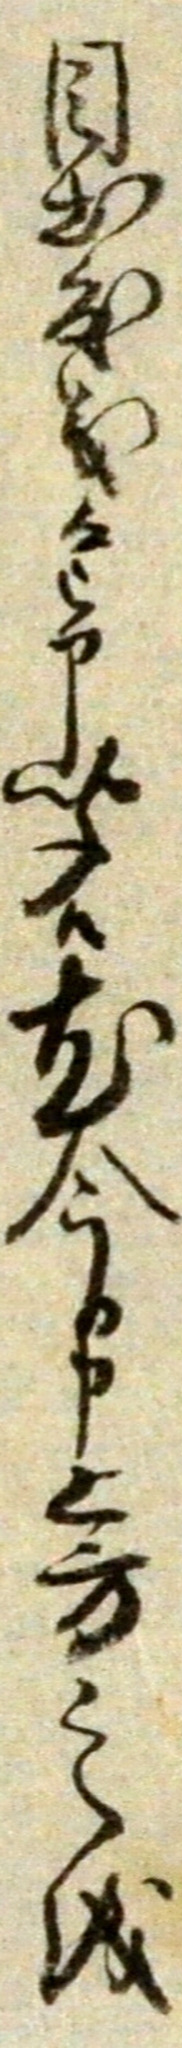目出度義と被申聞候尤今日申上方々之儀
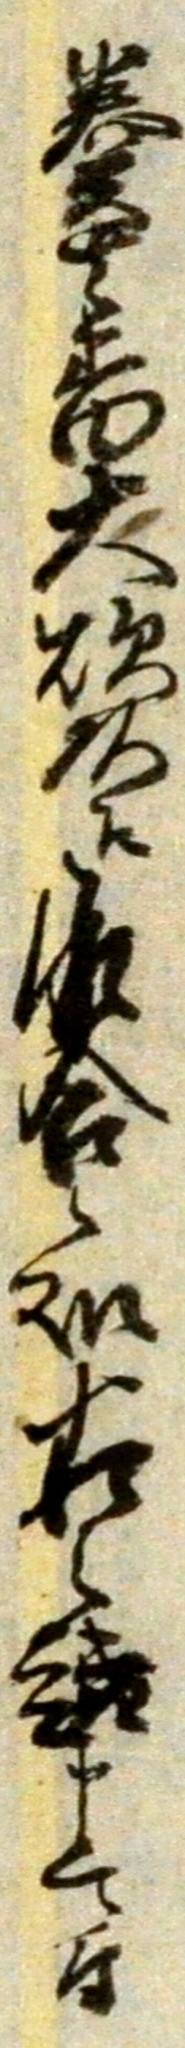奏者番大炊頭え承合之処右之趣申上候付
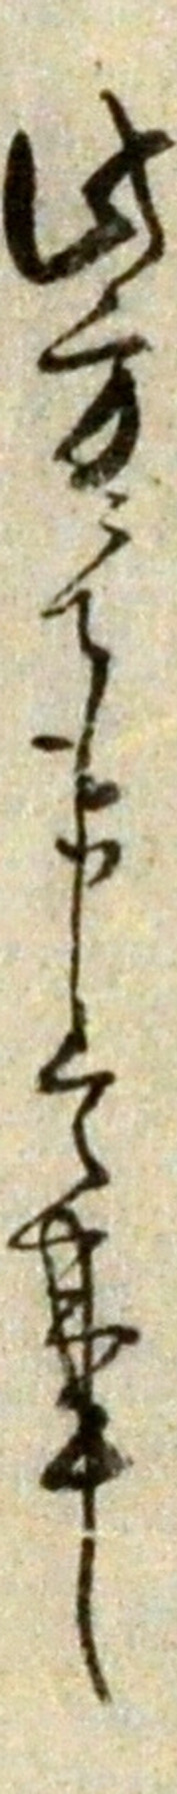此方にても申上候事
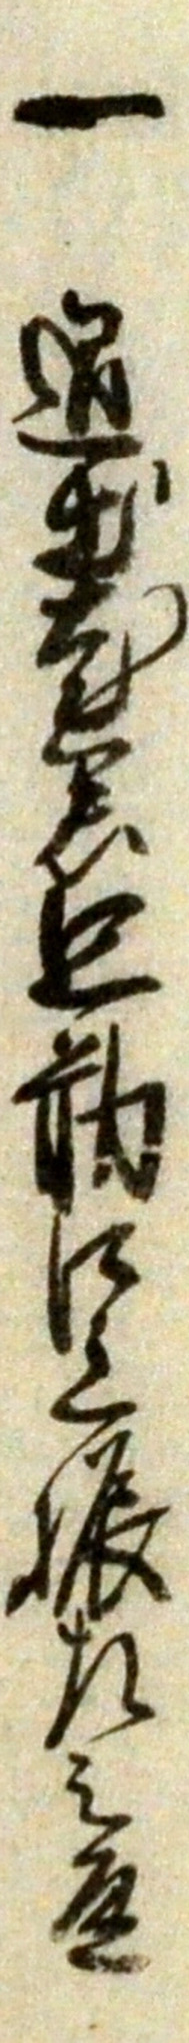一退出老若廻勤口上振左之通
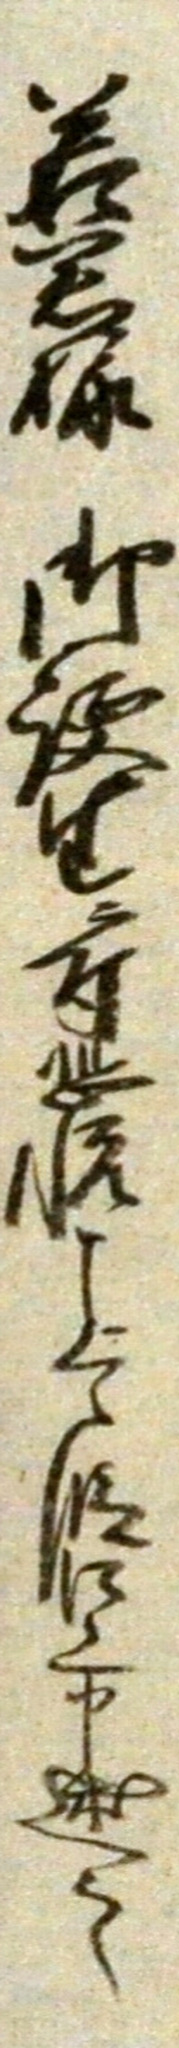若君様御誕生ニ付恐悦申上候段口上申述之
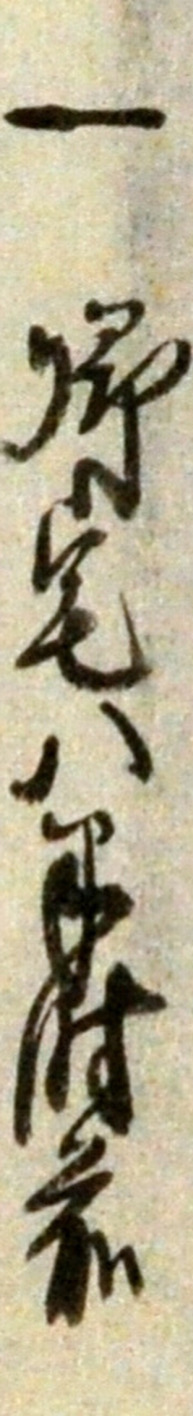一帰宅八半時前
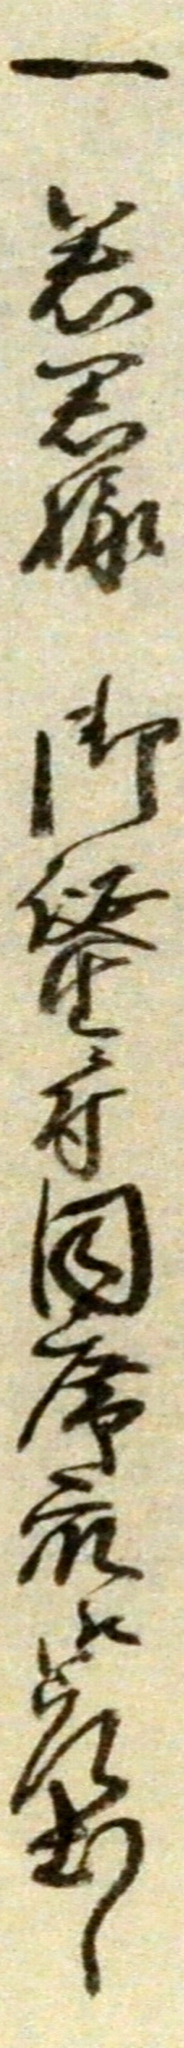一若君様御誕生ニ付同席衆え差出候
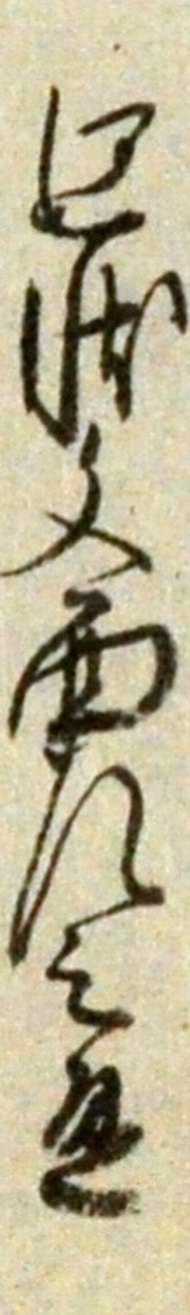廻状文面左之通
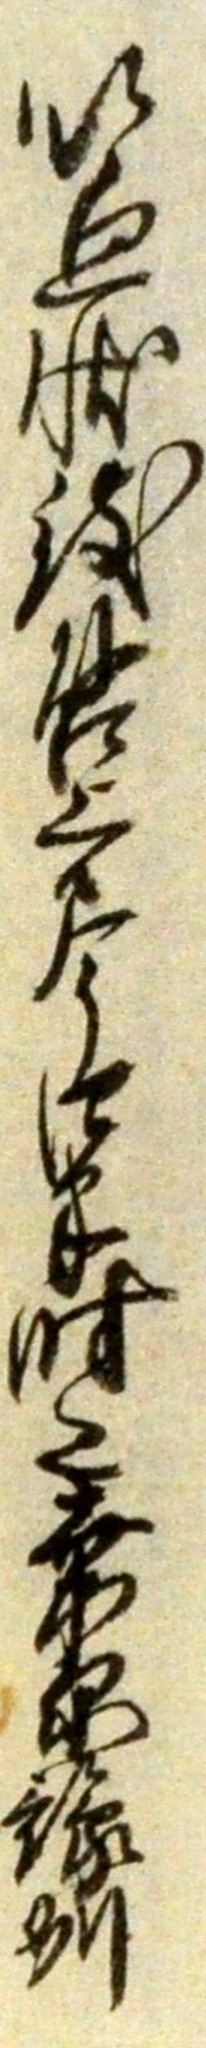以廻状致啓上候今四半時過桑原豫州

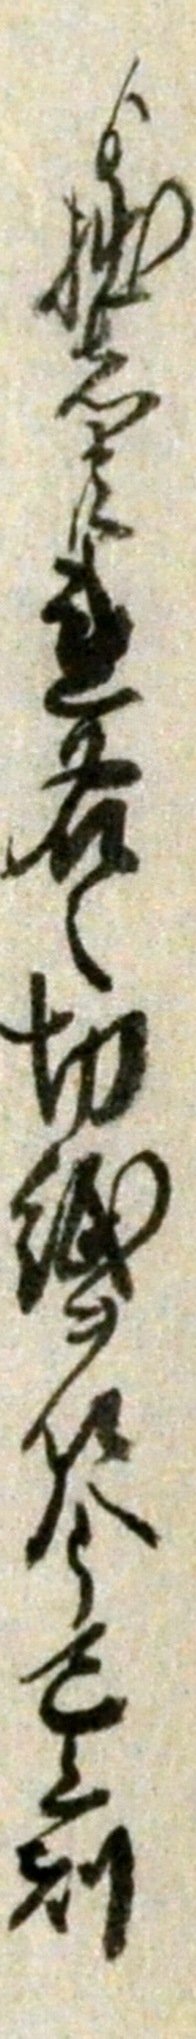ゟ拙者共連名之切紙ヲ以今巳上刻
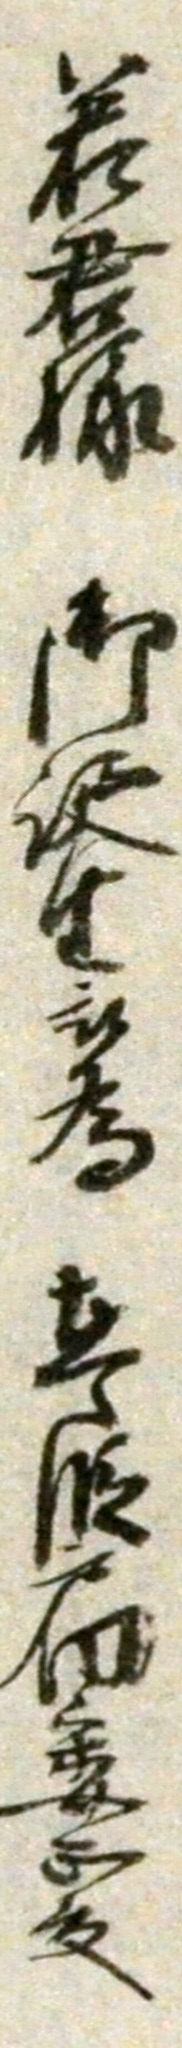若君様御誕生被為在候段戸田采女正殿
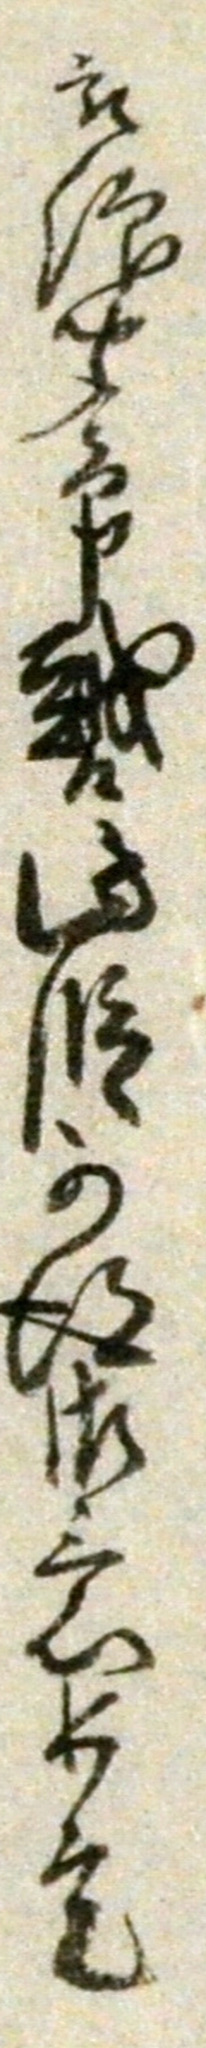被仰聞旨申越候此段可得御意如是
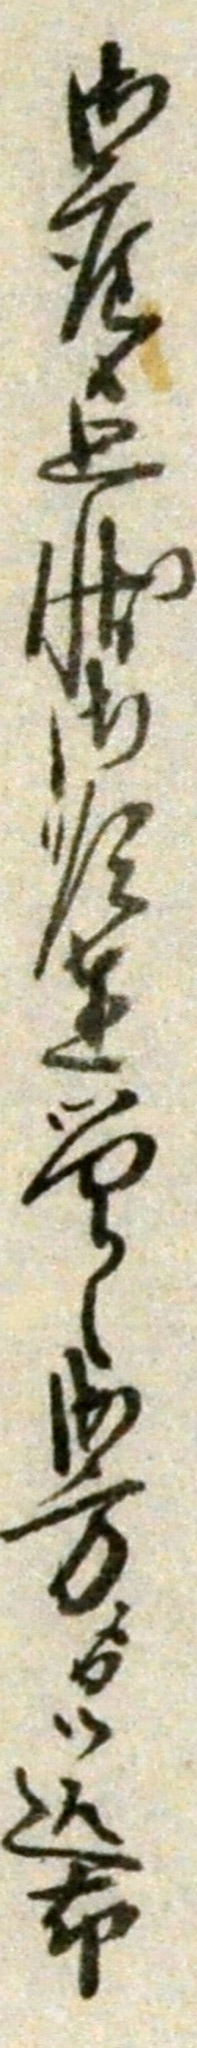御座候廻状御順達留り候御方ゟ御返却
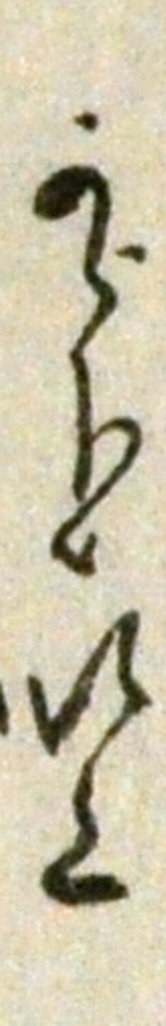可被下候以上
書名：若君様（家斉嫡男）誕生諸祝儀ノ節ノ留書外
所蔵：伊那市立高遠町図書館・合同会社AMANE
